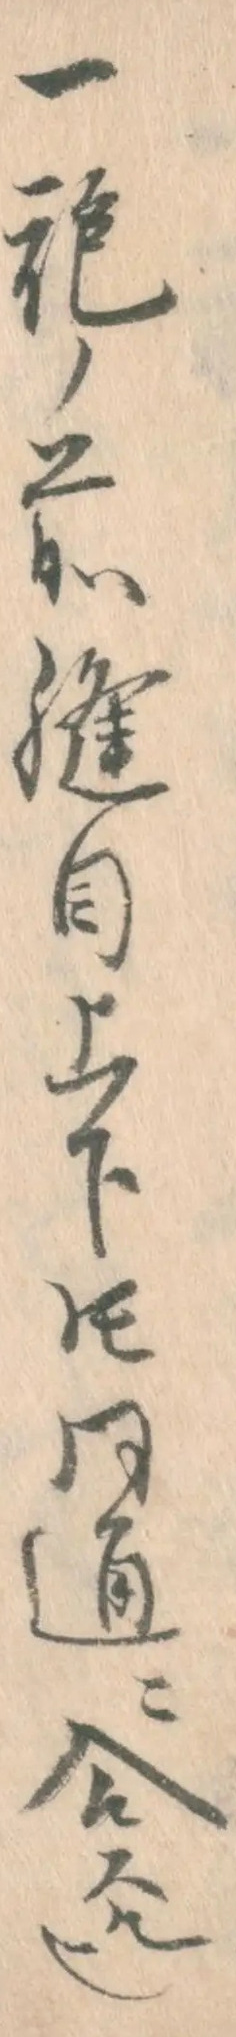一袍ノ前縫目上下トモ同通ニ合スル也
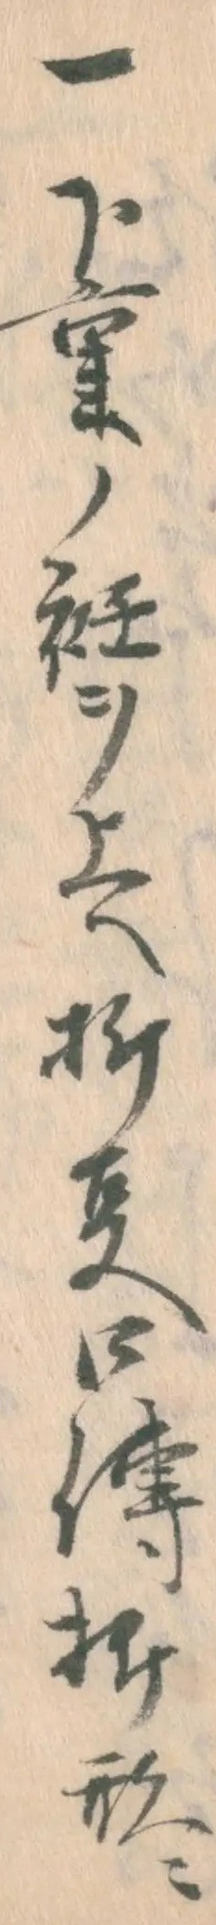一下重ノ衽ヲ上ヘ折事口伝折形ニ
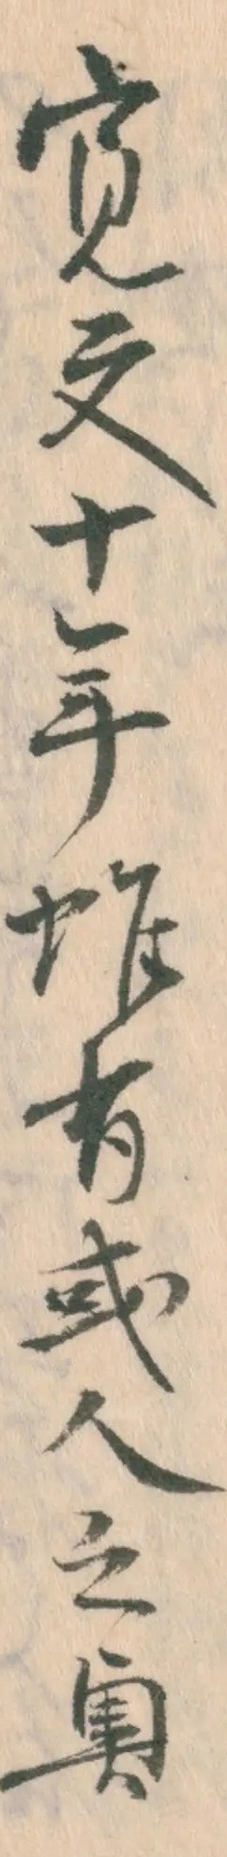寛文十年雖有或人之奥
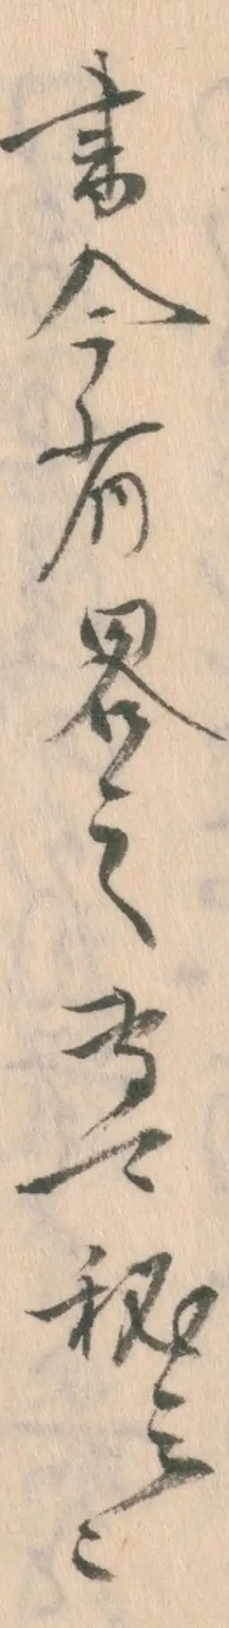書今省略之専可秘云々

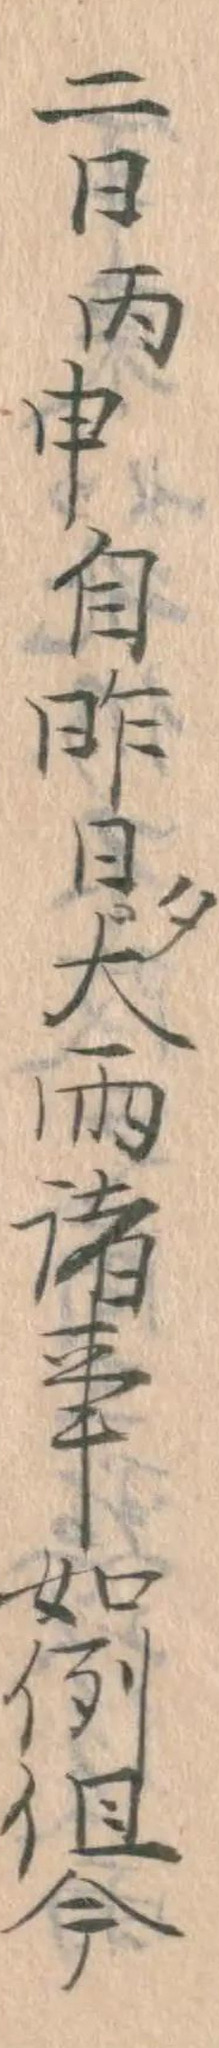二日丙申自昨日◦大雨諸事如例但今
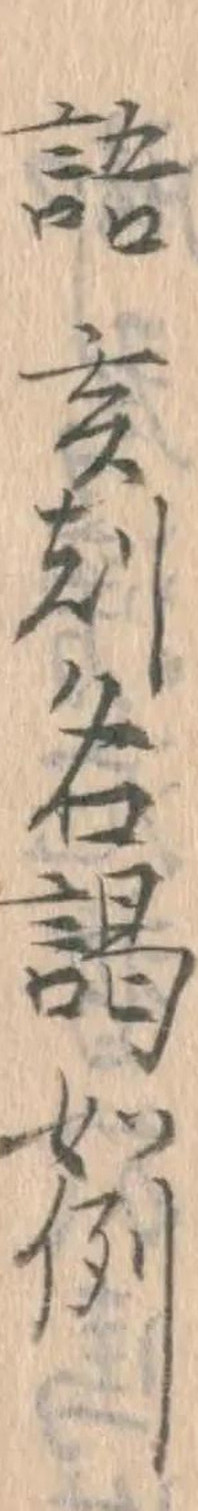語亥刻各謁如例
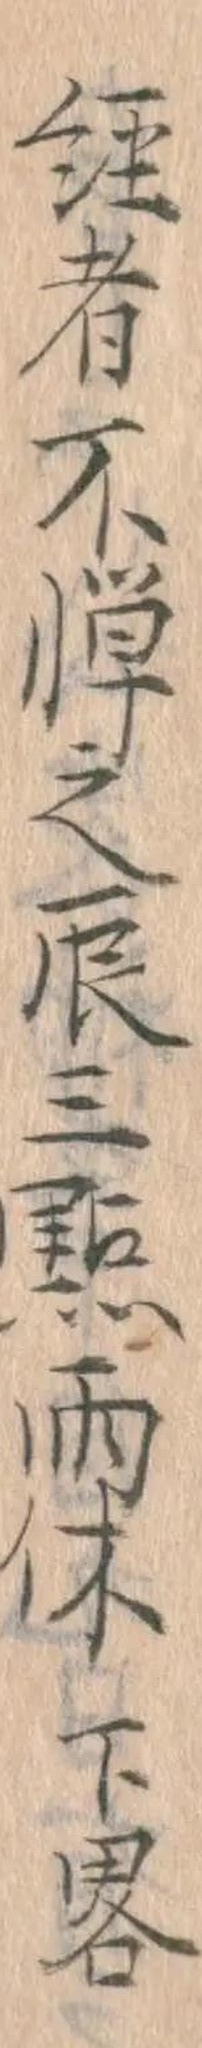経者不憚之辰三点雨休下略
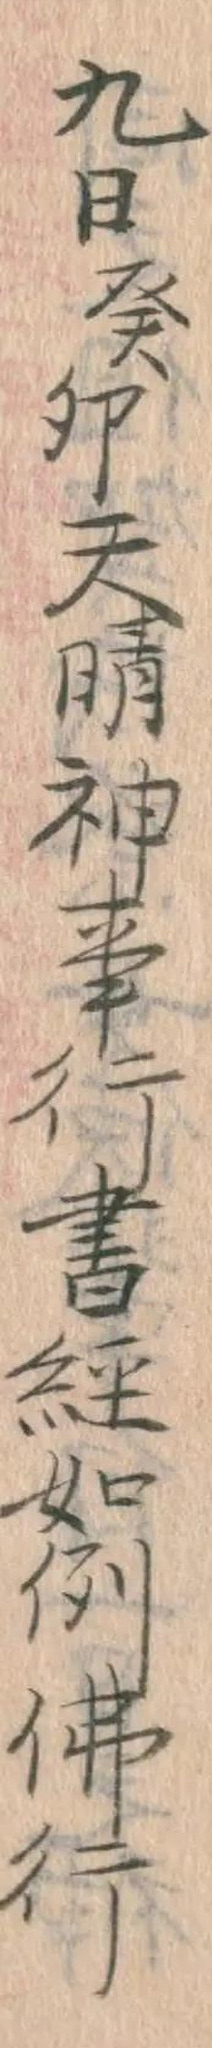九日癸卯天晴神事行書経如例仏行
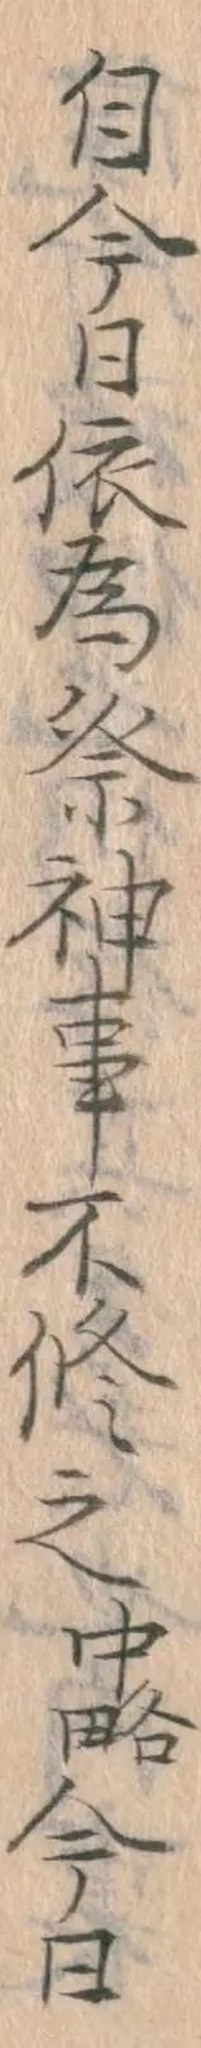自今日依為祭神事不修之中略今日
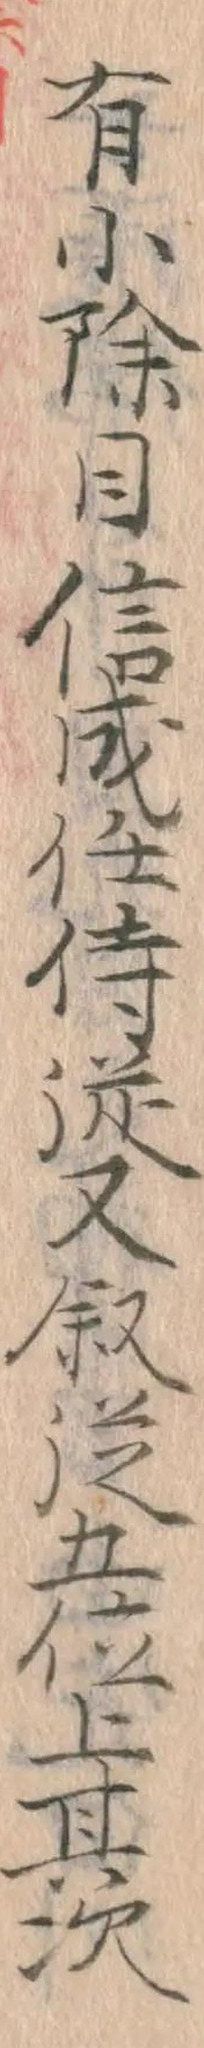有小除目信成任侍従又叙従五位上其次
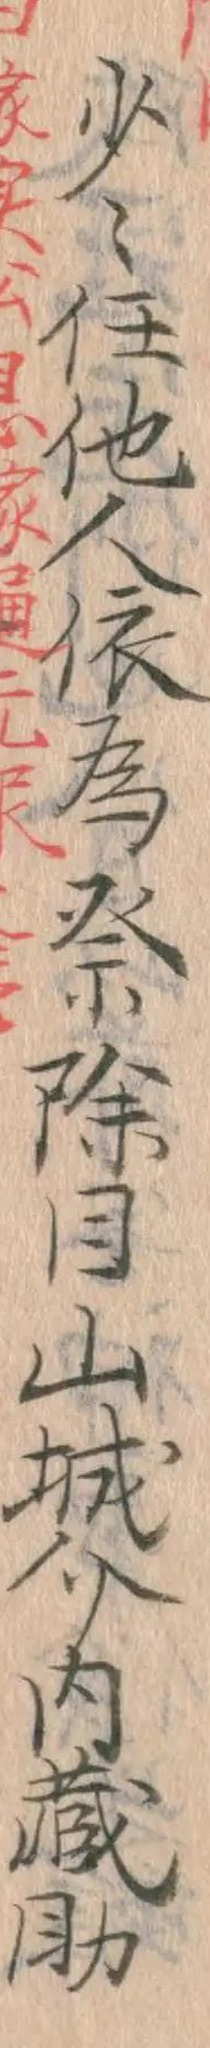少々任他人依為祭除目山城介内蔵助
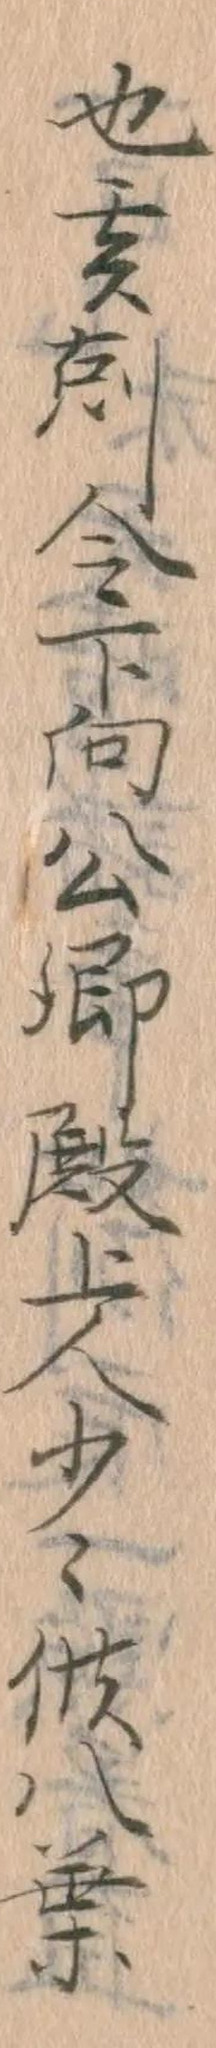也亥刻令下向公卿殿上人少々候八葉
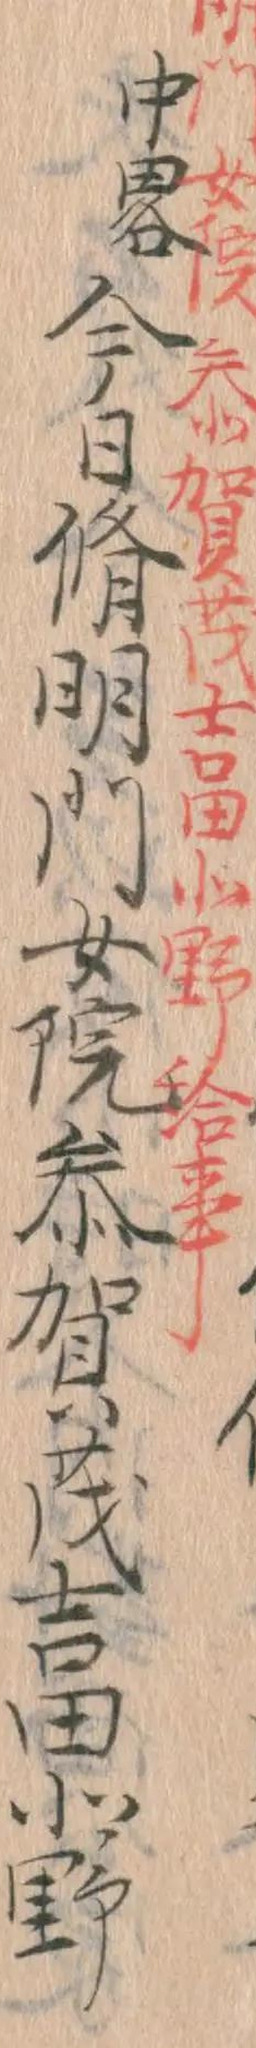中略今日修明門女院参賀茂吉田北野
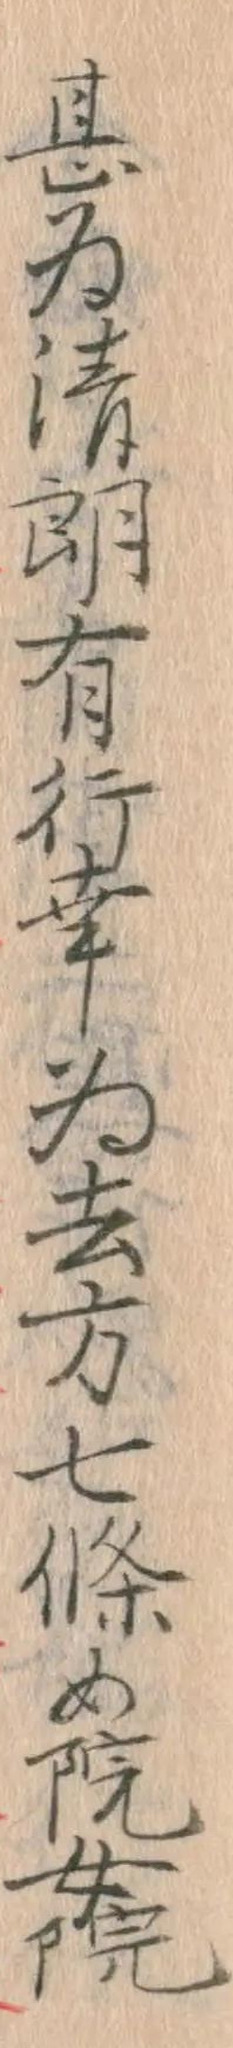甚為清朗有行幸為去方七条女院女院
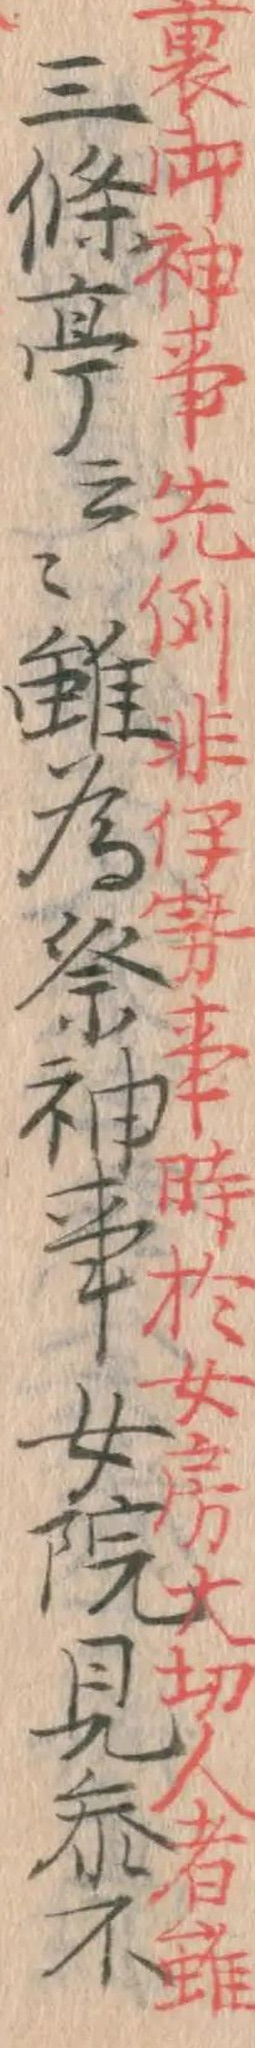三条亭云々雖為祭神事女院見参不
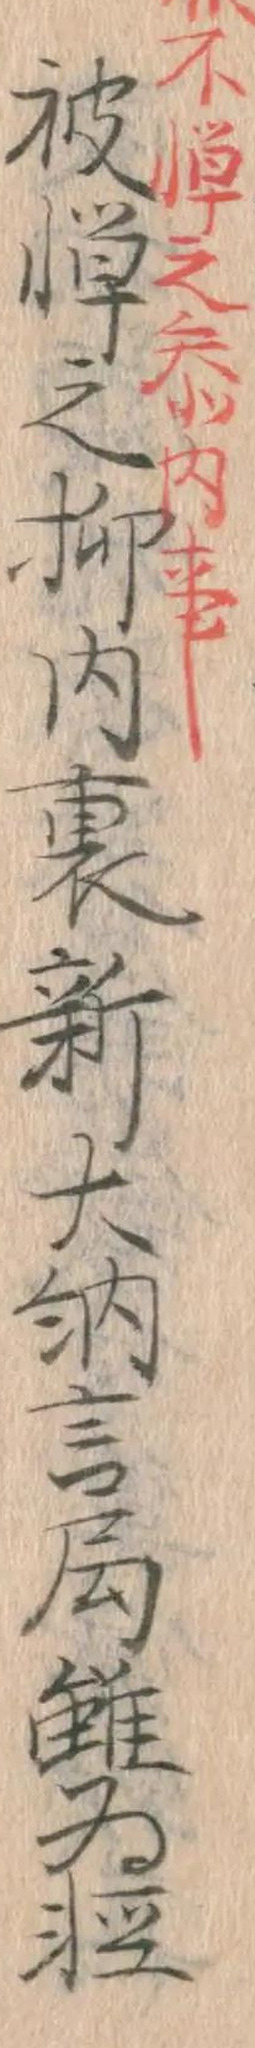被憚之抑内裏新大納言局雖為軽
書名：賀茂社記録. 第80冊
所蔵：国立国会図書館 National Diet Library, JAPAN
